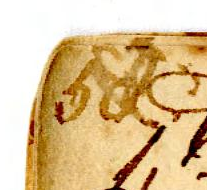58
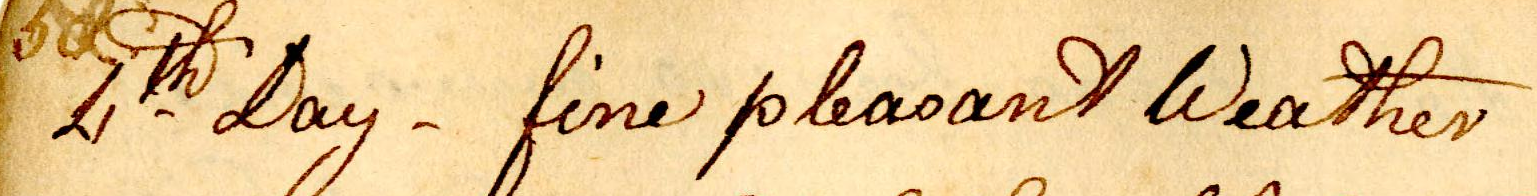4^th. Day- fine pleasant Weather
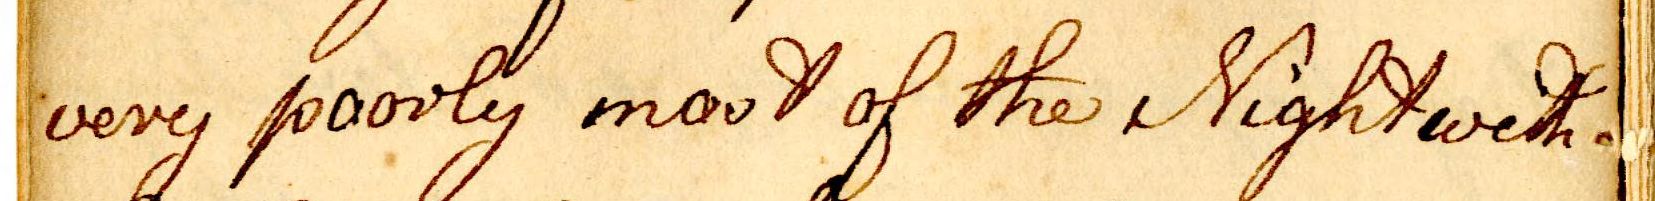very poorly most of the Night with
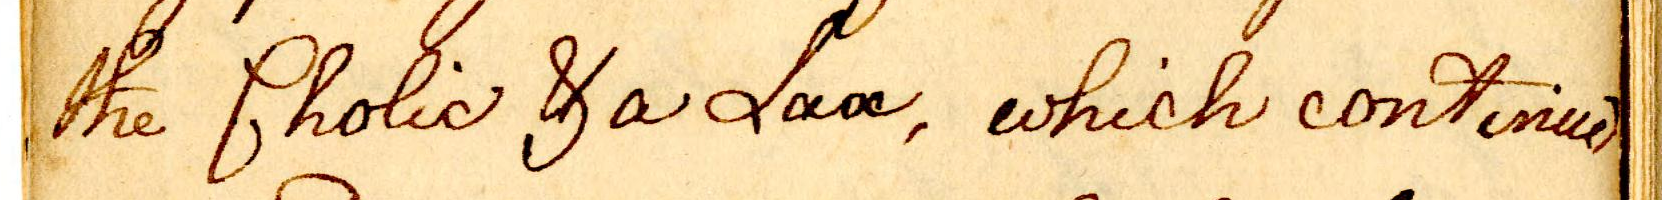the Cholic & a Lax, which continued
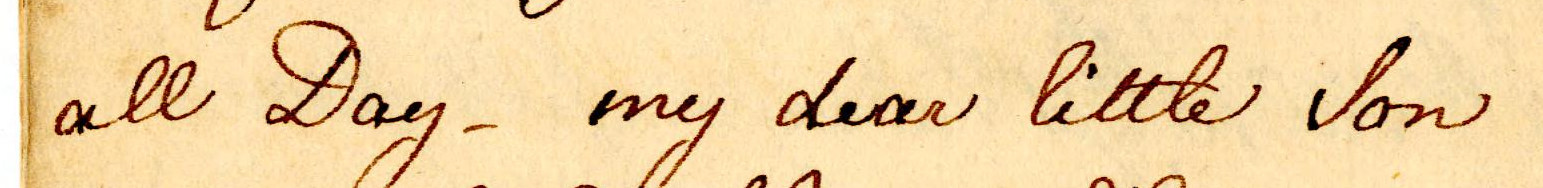all Day- my dear little Son
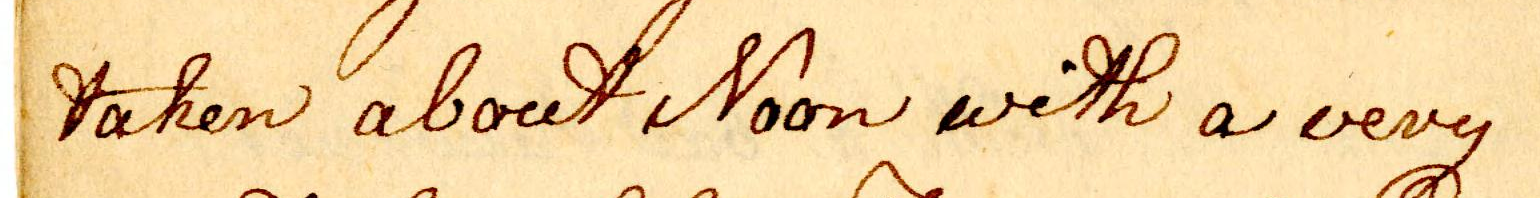taken about Noon with a very
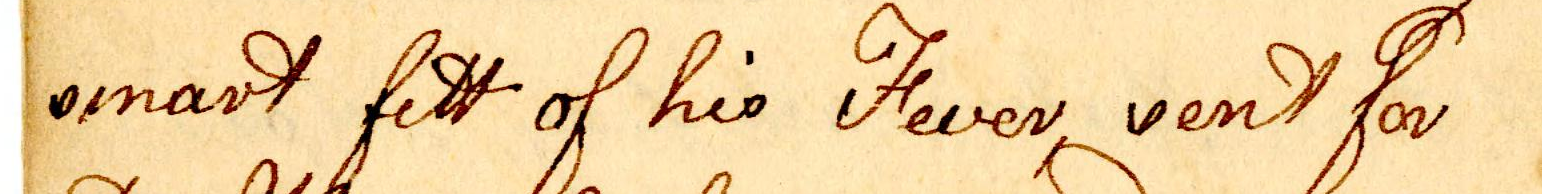smart fitt of his Fever, sent for
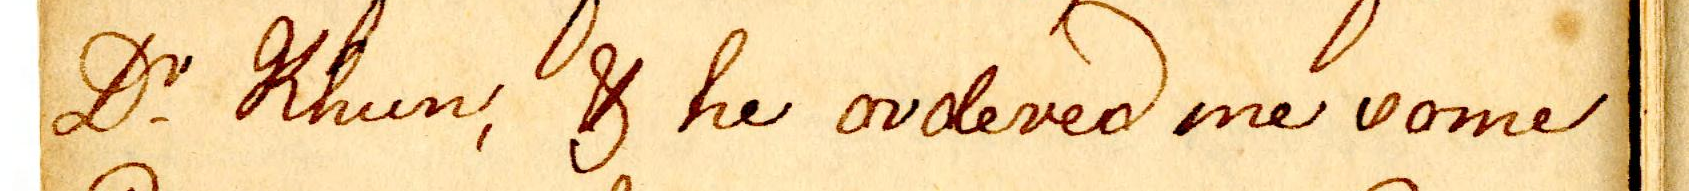D^r. Khun, & he ordered me some
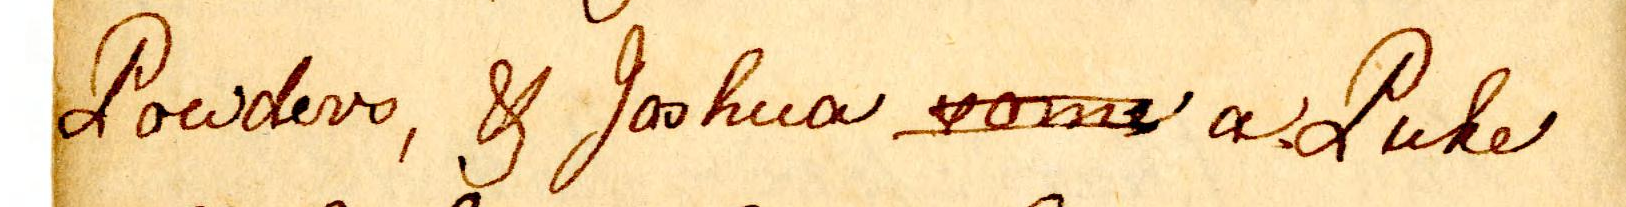Powders, & Joshua [some] a Puke
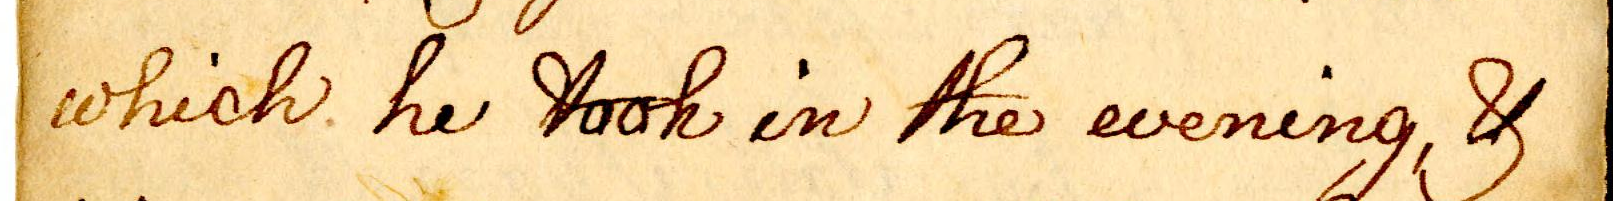which he took in the evening, &
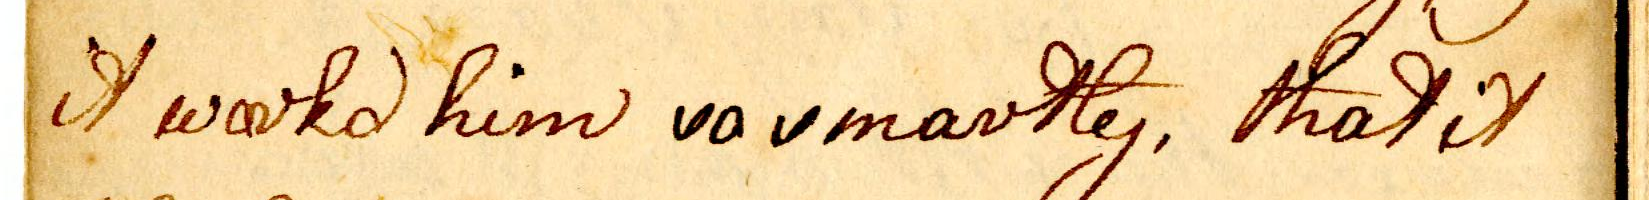it workd him so smartly, that it
